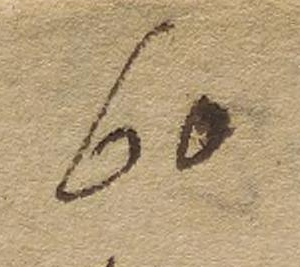60
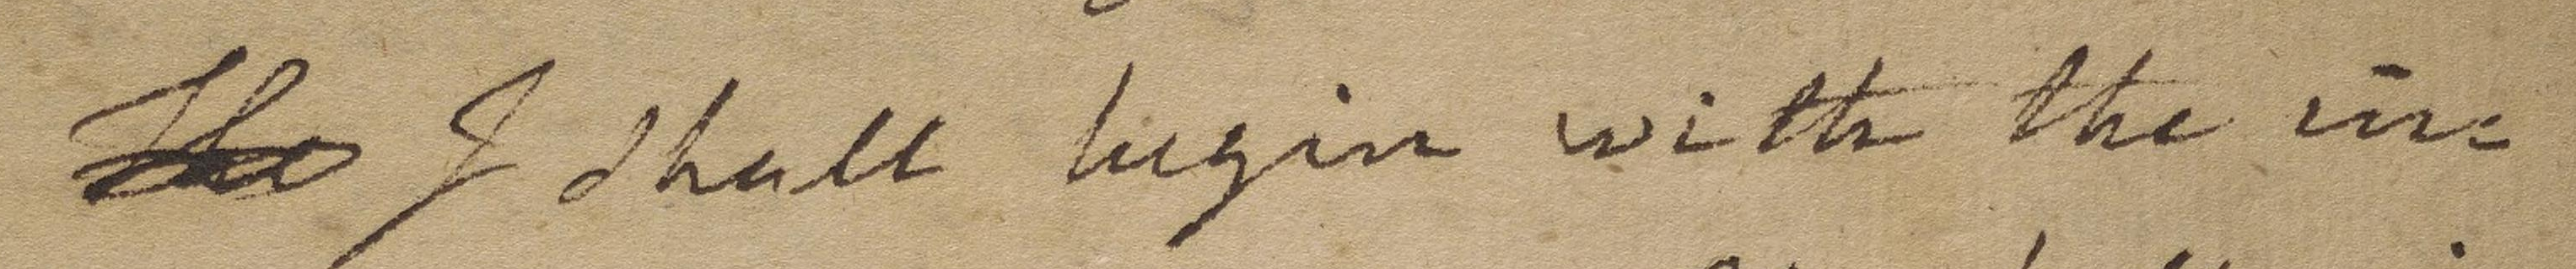[The] I shall begin with the in-
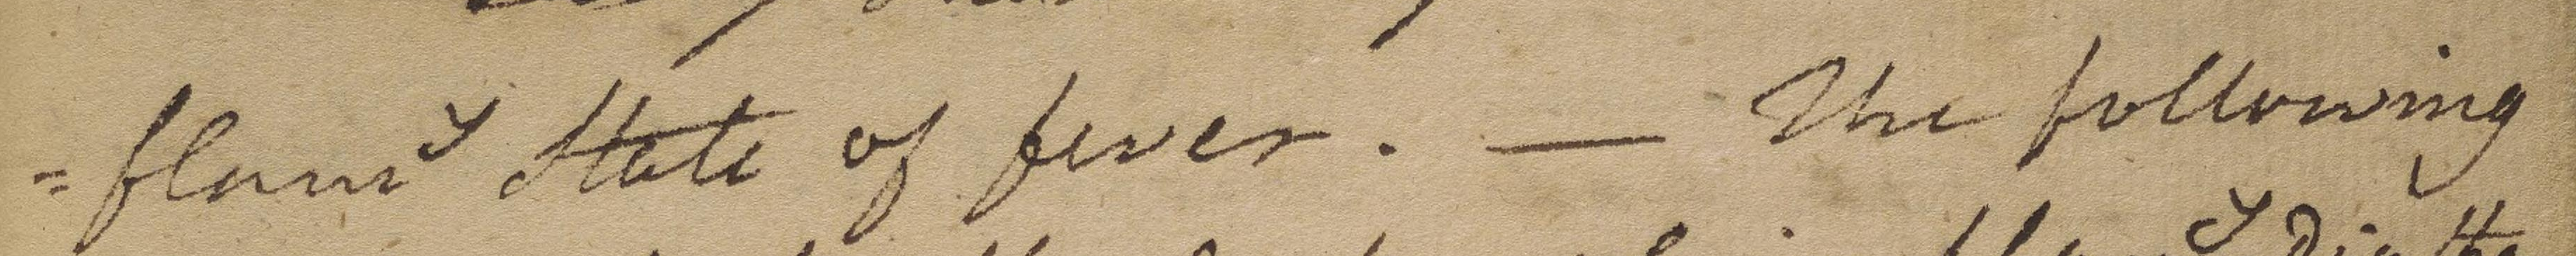-flam^y state of fever.- The following
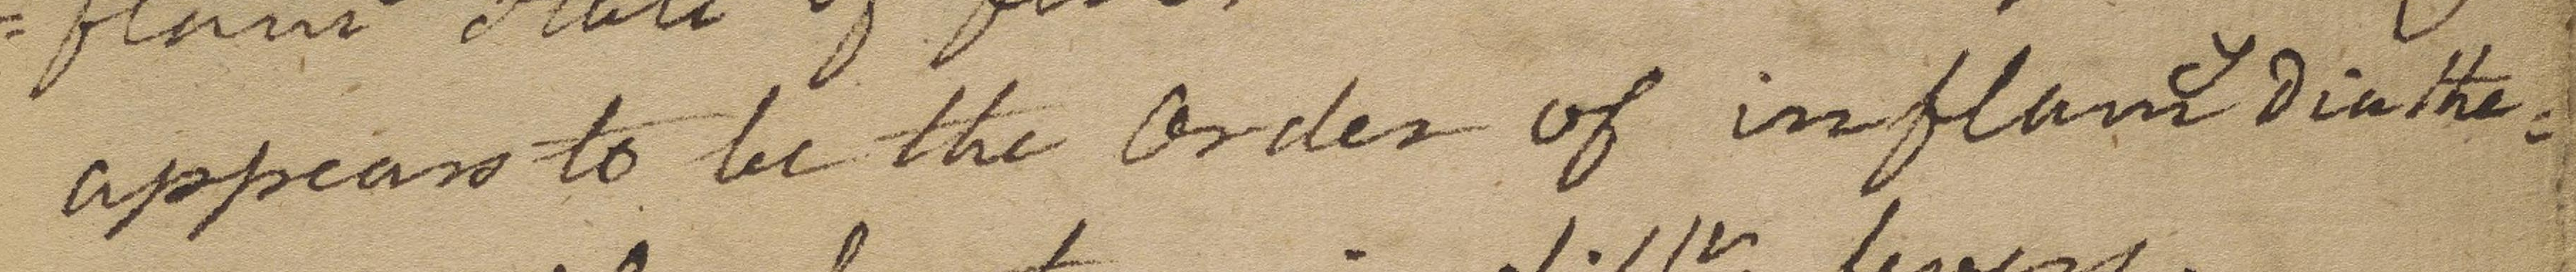appears to be the order of inflam^y diathe-
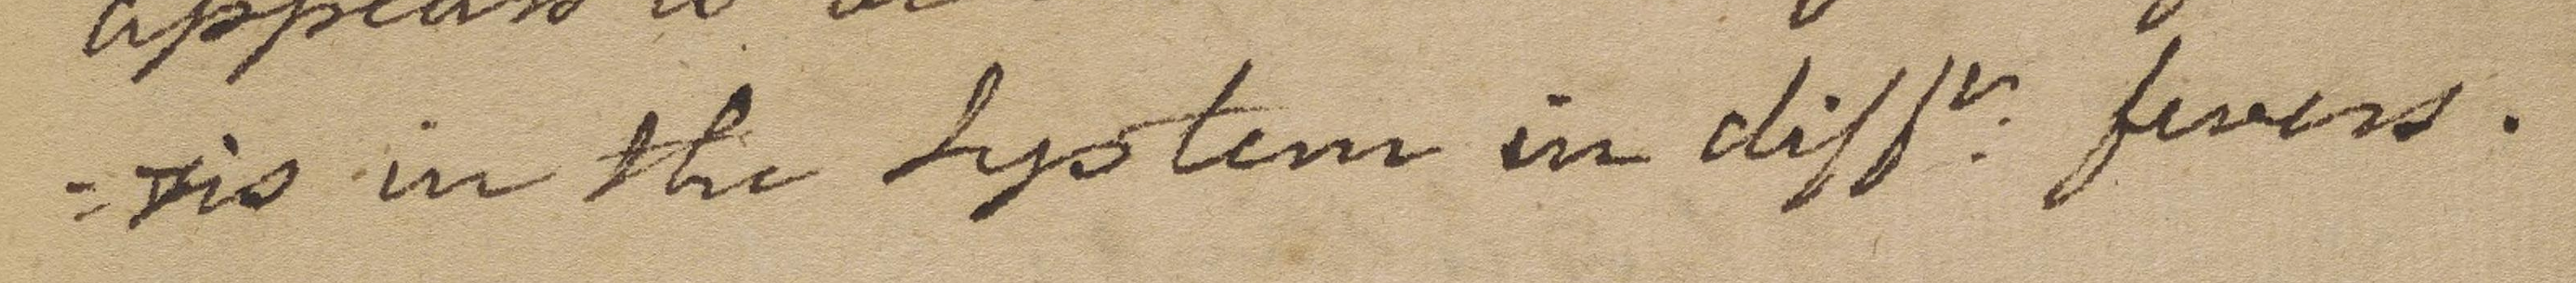-sis in the System in diff^r: fevers.
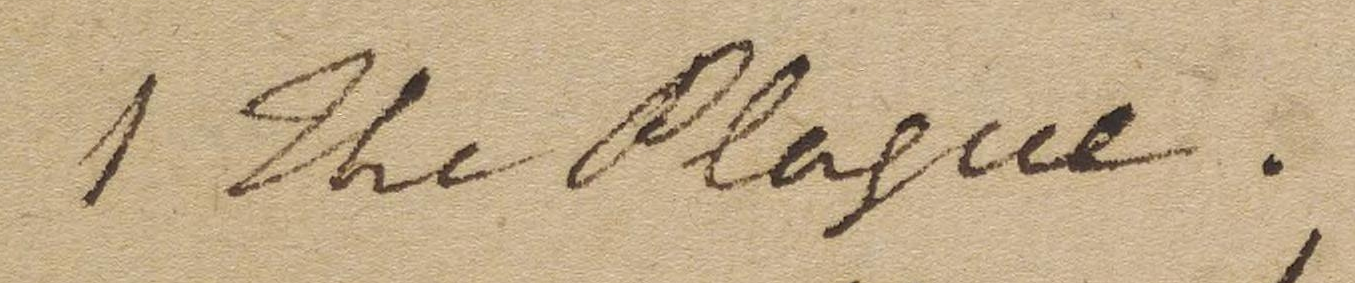1 The Plague.
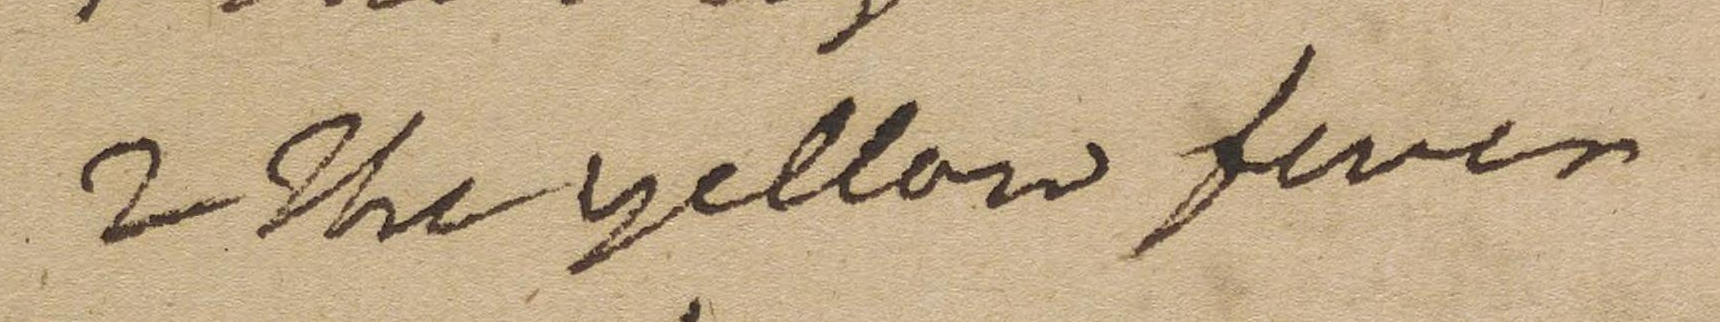2 The yellow fever
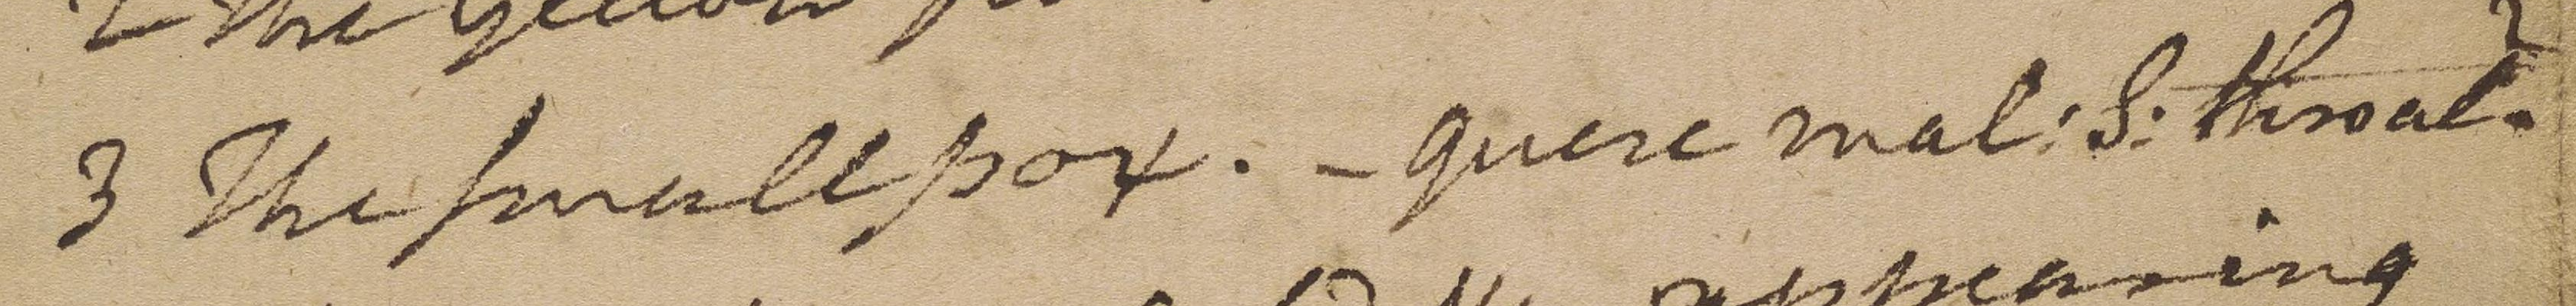3 The Smallpox.- quere mal. S. throat?
